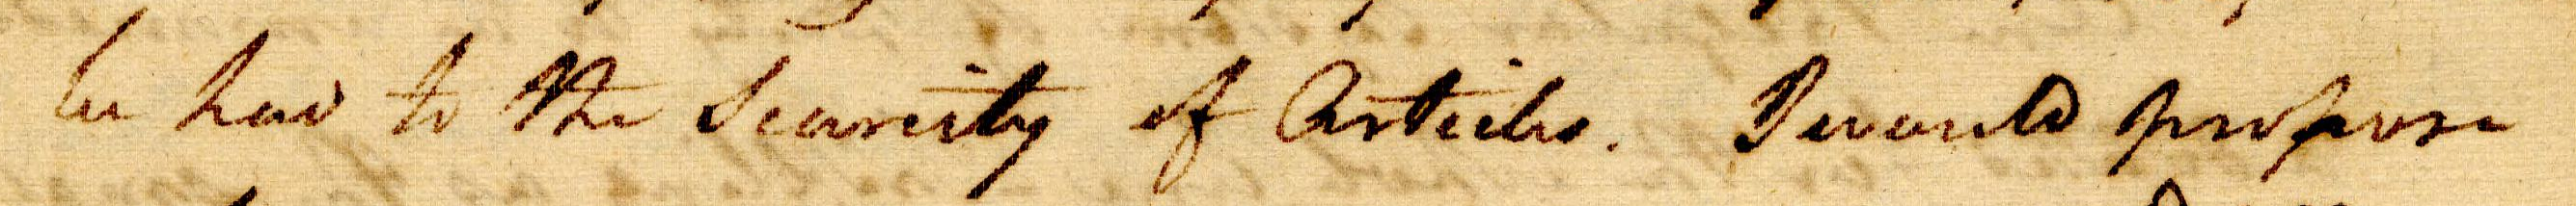be had to the Security of Articles. I would propose
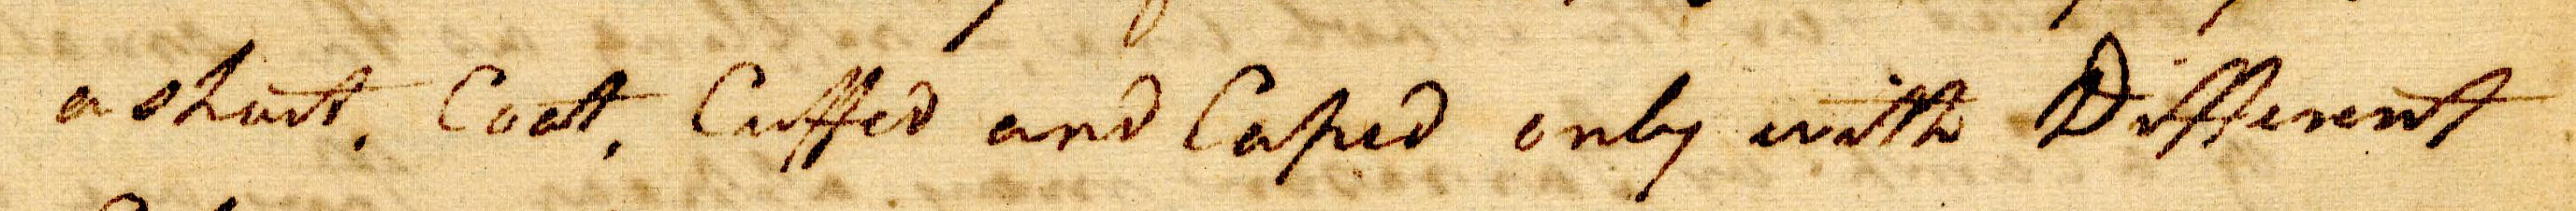a short, Coat, Cuffed and Caped only with Different
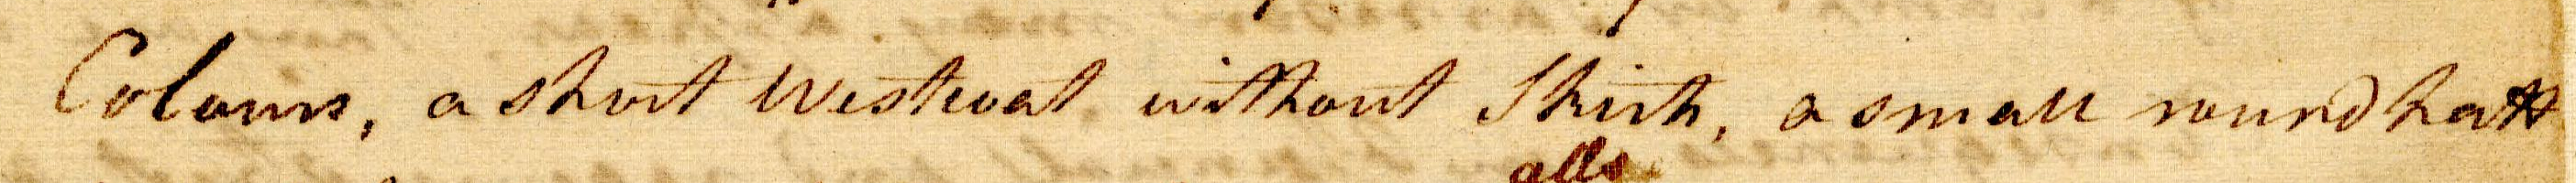Colours, a short Westcoat without skirts, a small round hatt
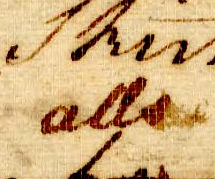alls
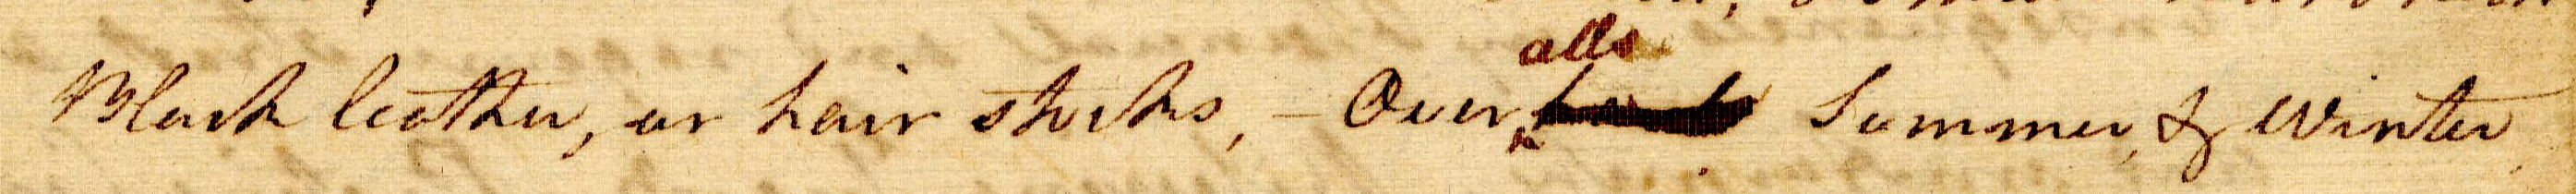Black leathe, or hair stocks,- Over ^ [_____] Summer & Winter
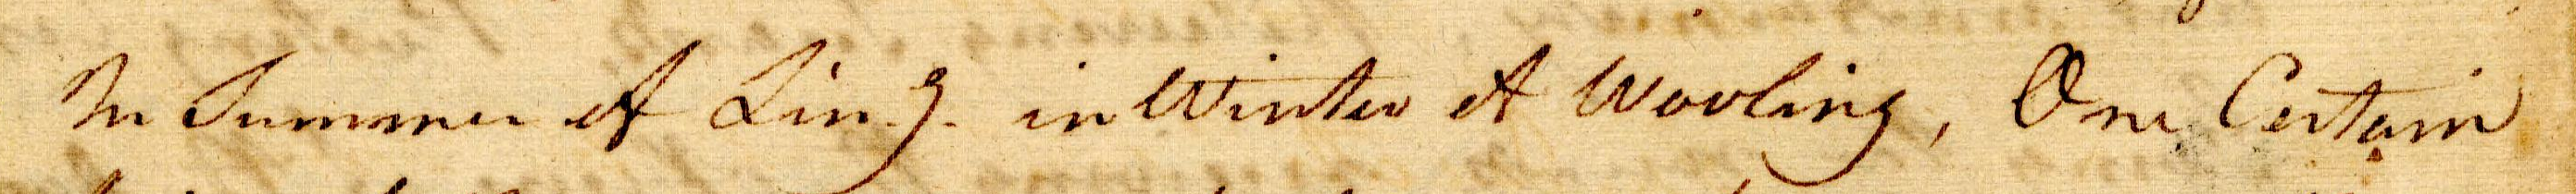In Summer of Lin^g. in Winter of Wooling, One Certain
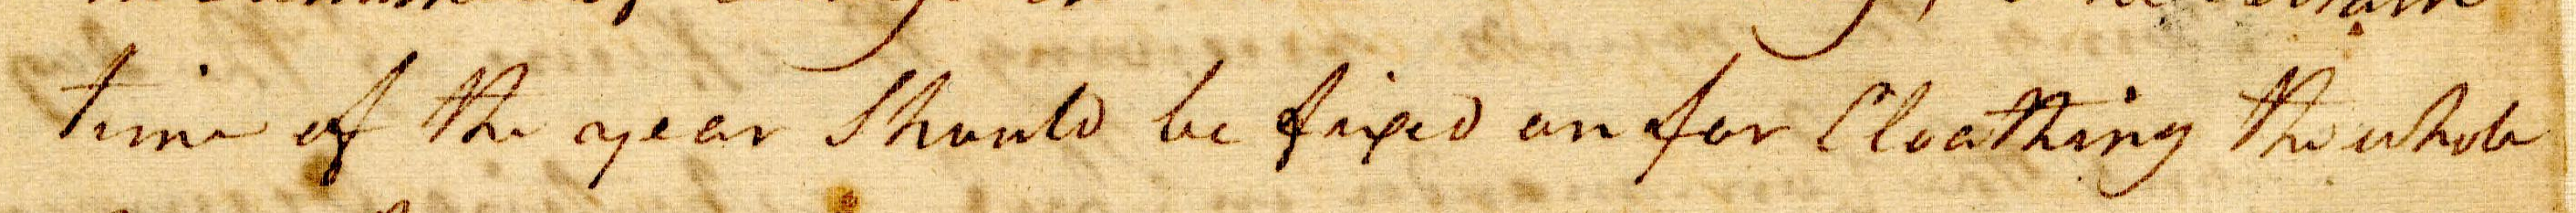time of the year should be fixed on for Cloathing the whole
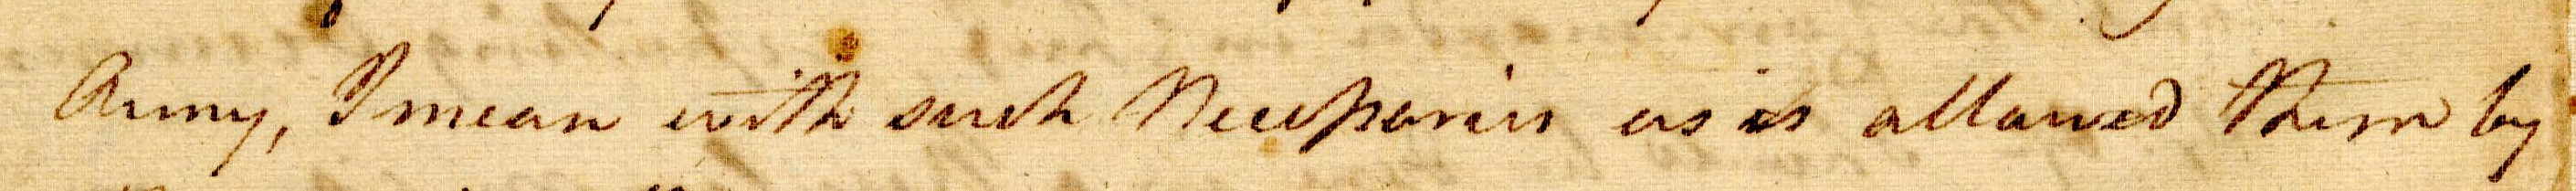Army, I mean with such Necessaries as is allowed them by
